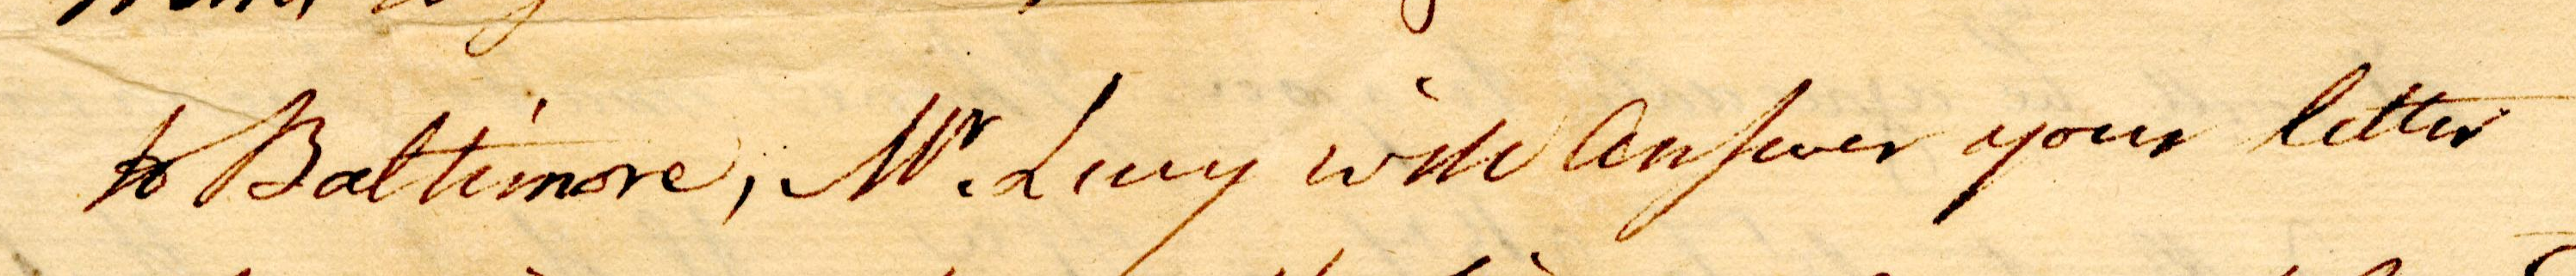to Baltimore, M^r. Levy will answer your letter
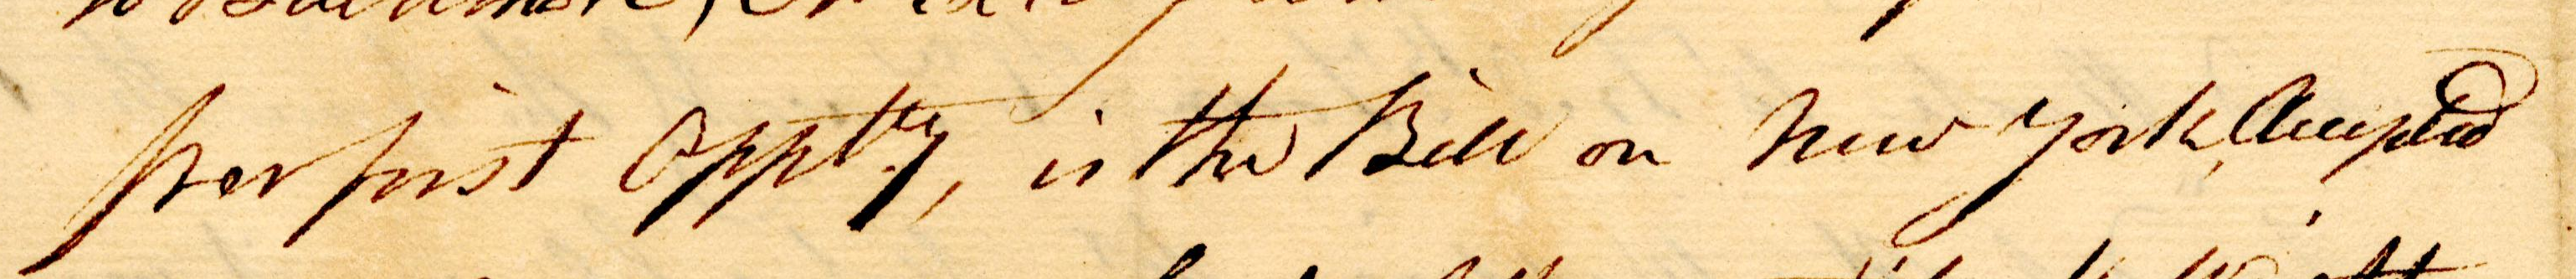per first opp^ty, is the Bill on New York, accepted
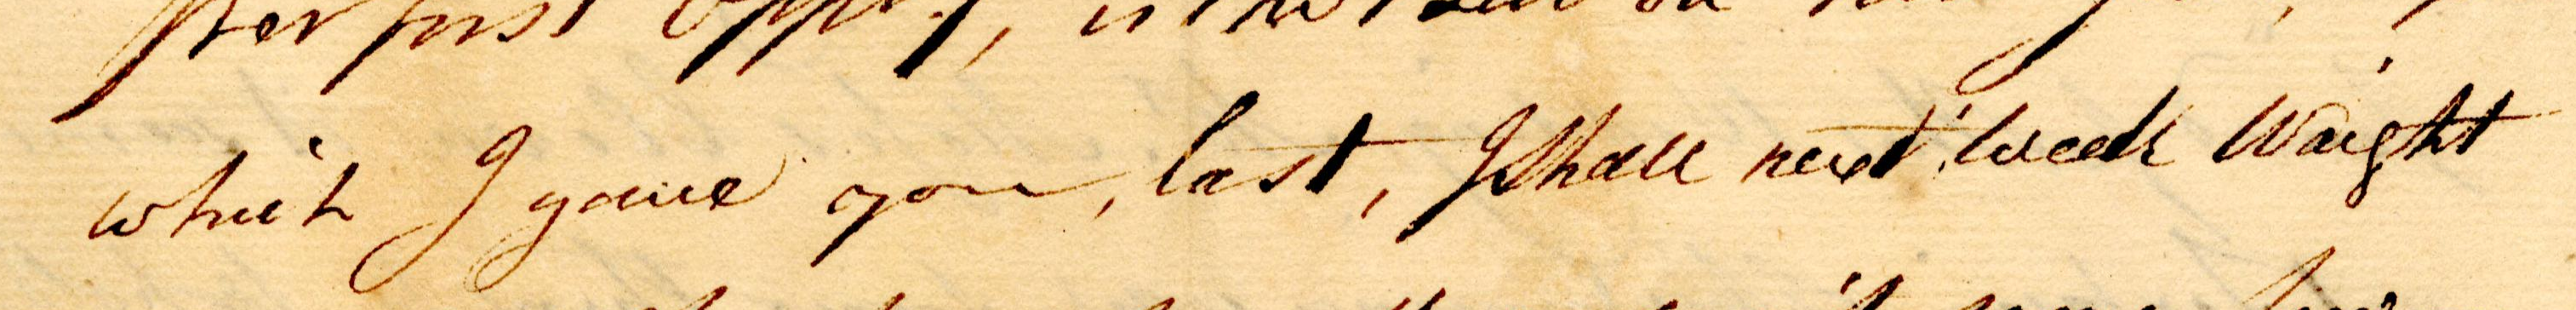which I give you, last, I shall next week Wright
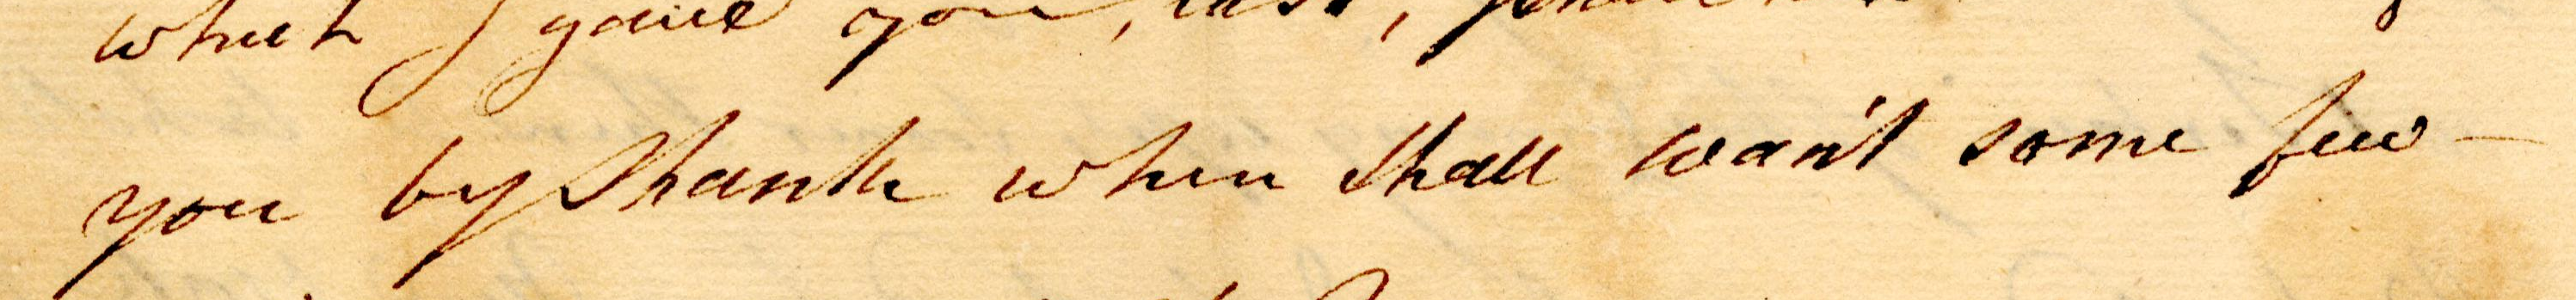you by Shank when shall want some few.-
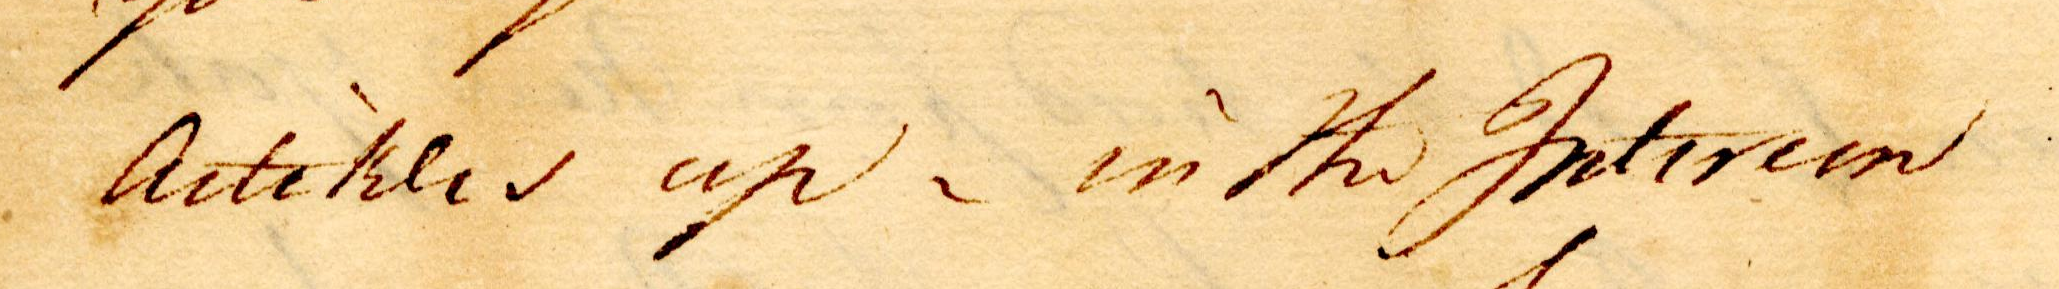artikles up.- in the Interim
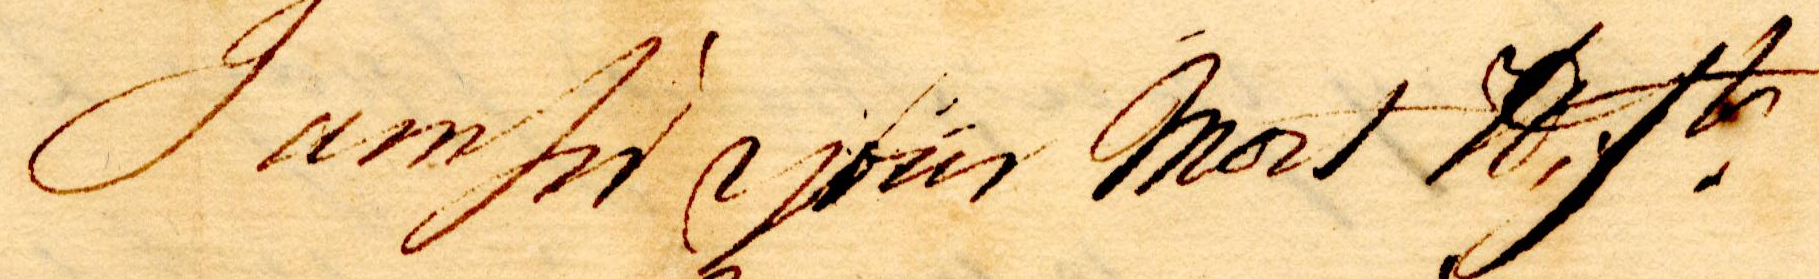I am sir your most H. S^t.
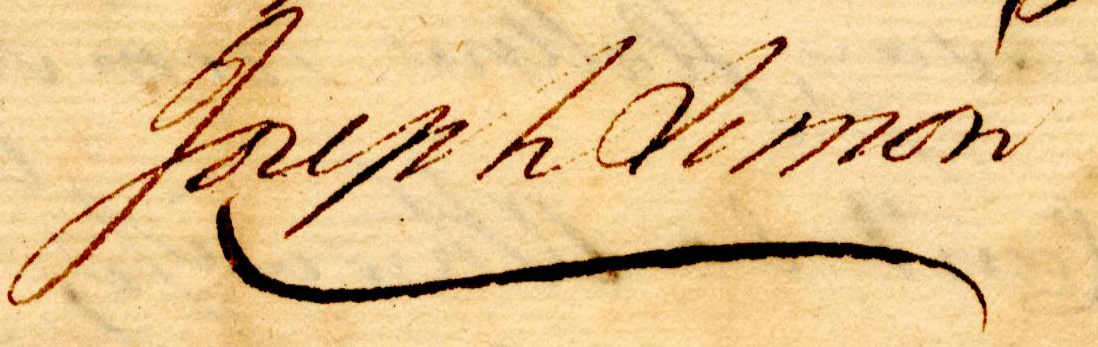Joseph Simon
